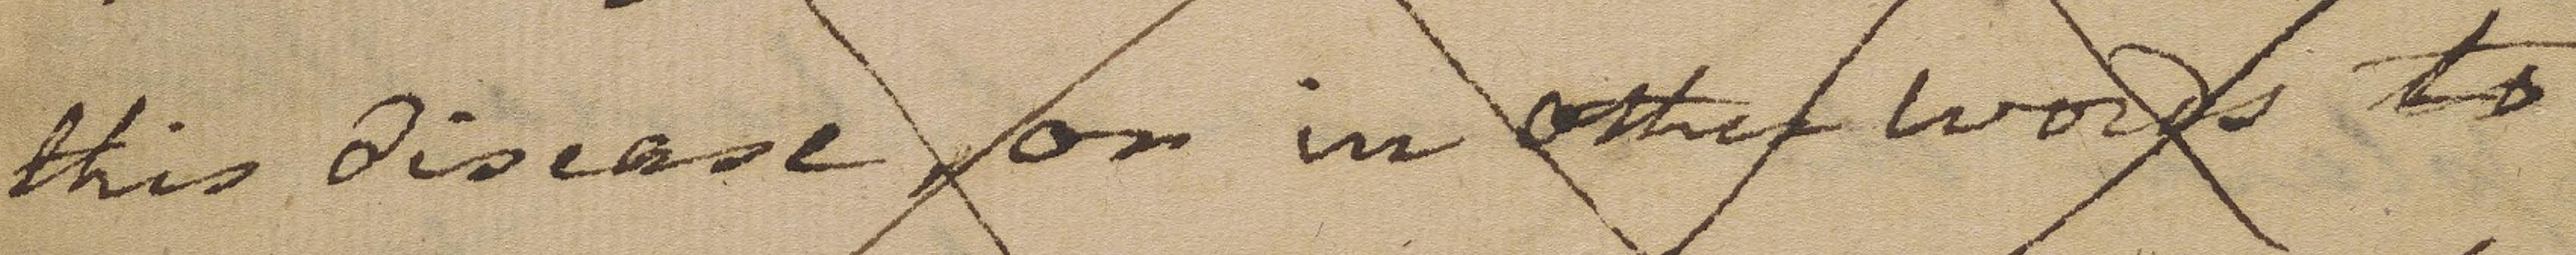this disease, or in other words to
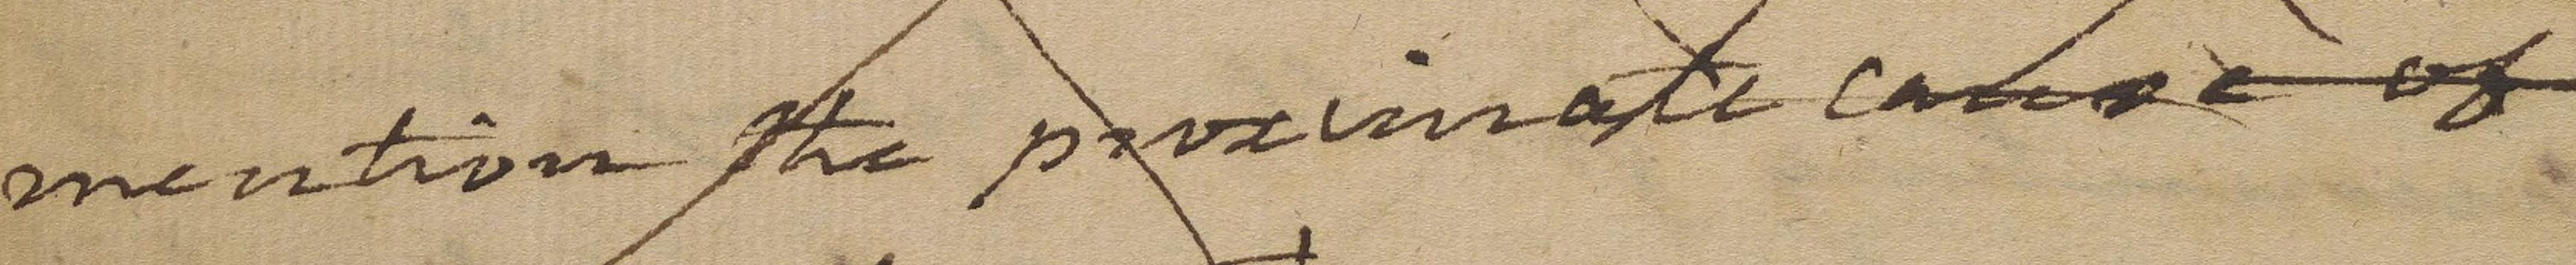mention the proximate cause [of]
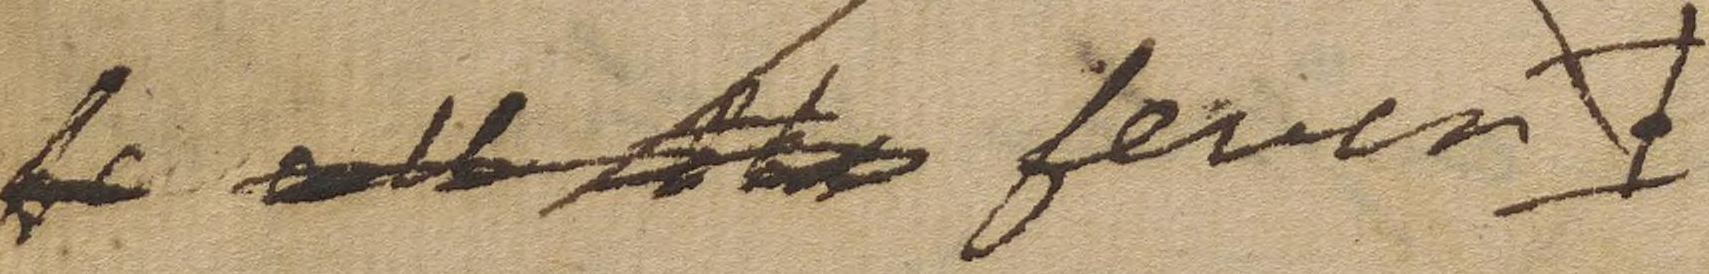[__] [______] fever.)
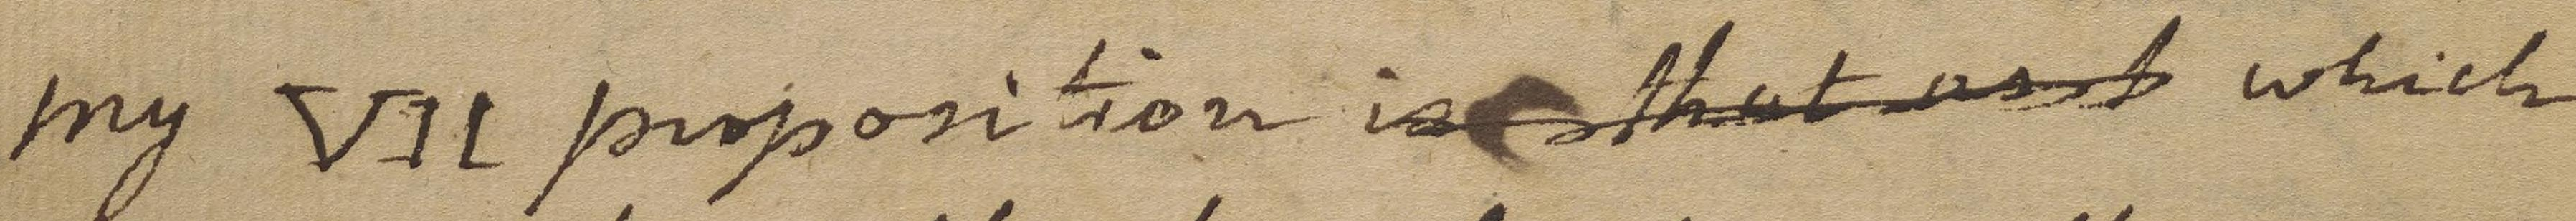My VII proportion is [that ____] which
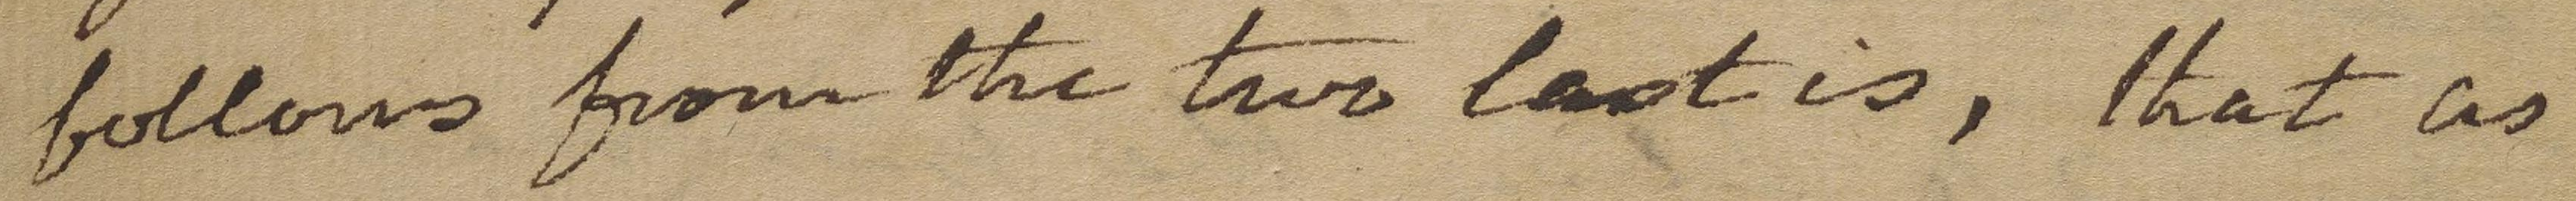follows from the two last is, that as
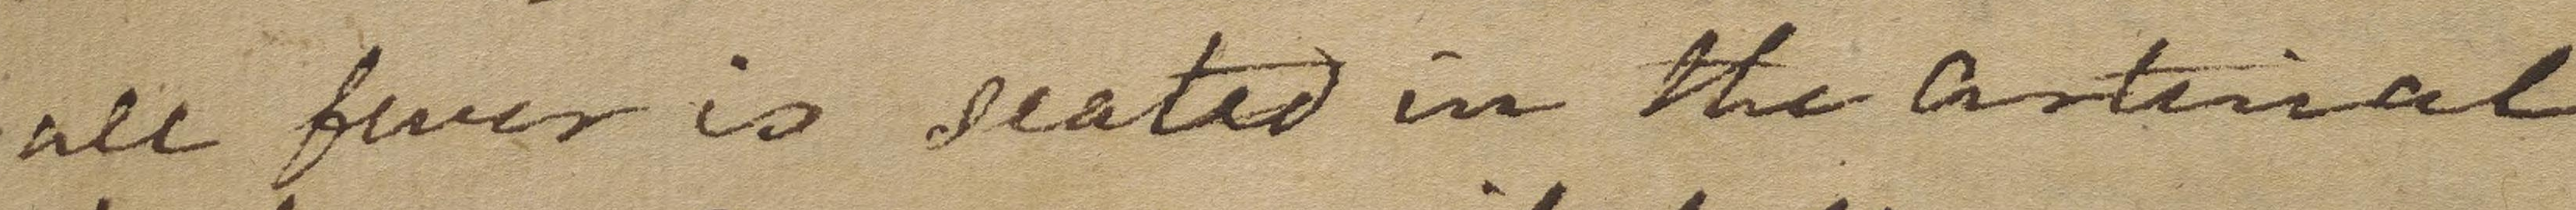all fever is seated in the arterial
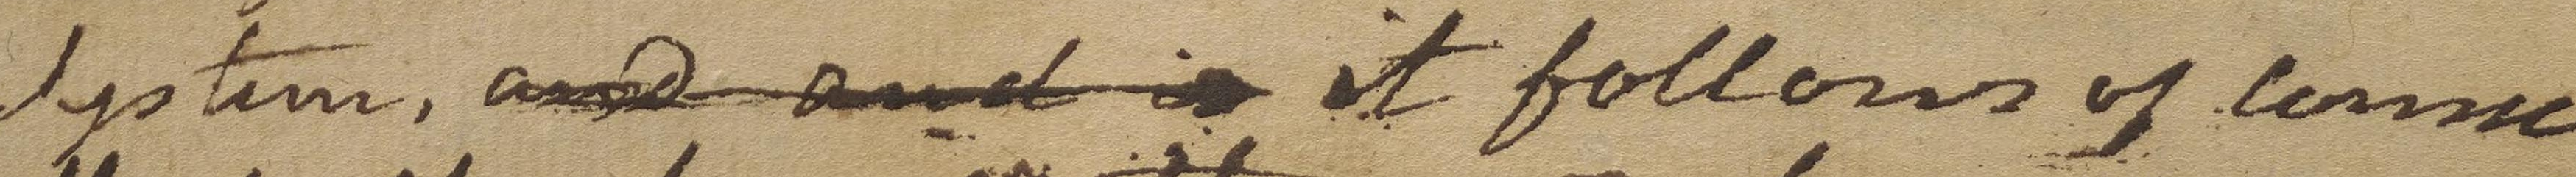system, [and and is] it follows of course
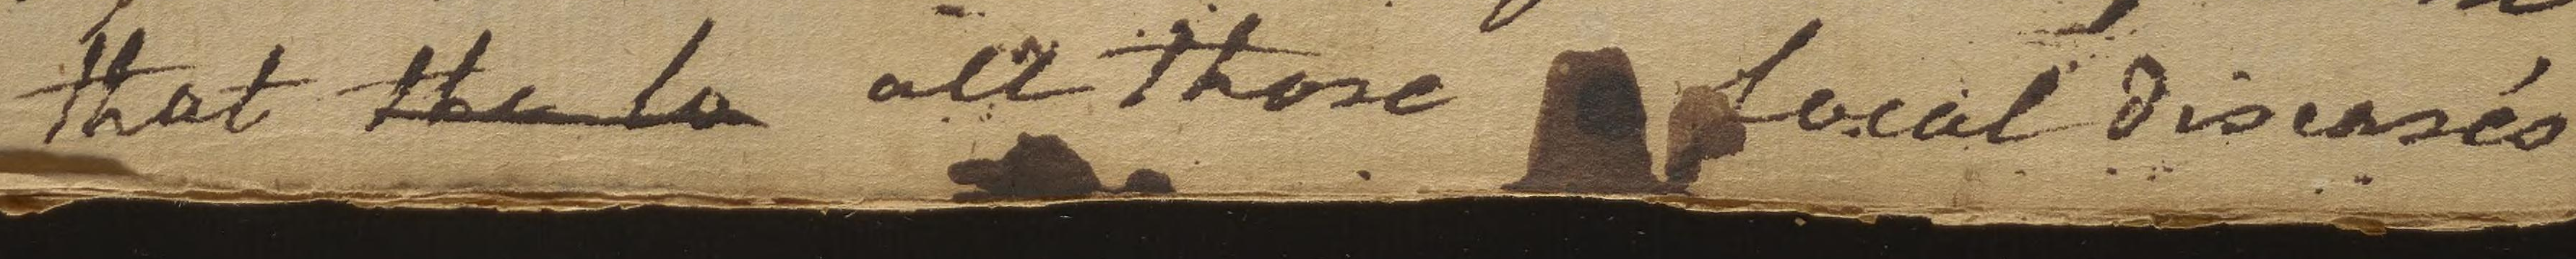that [the lo] those Local diseases
